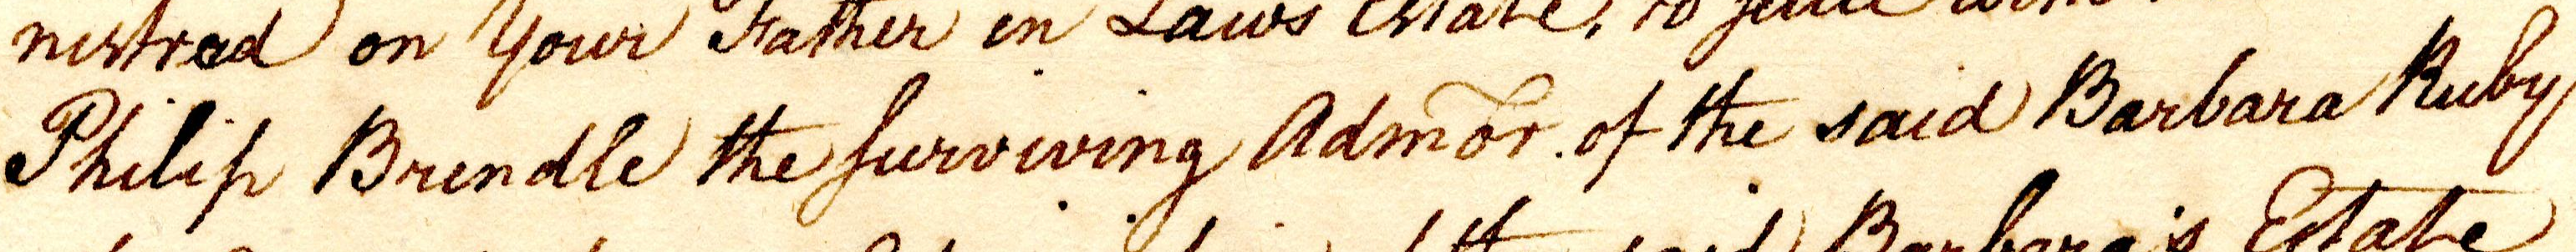Philip Brendle the surviving Admor. of the said Barbara Ruby
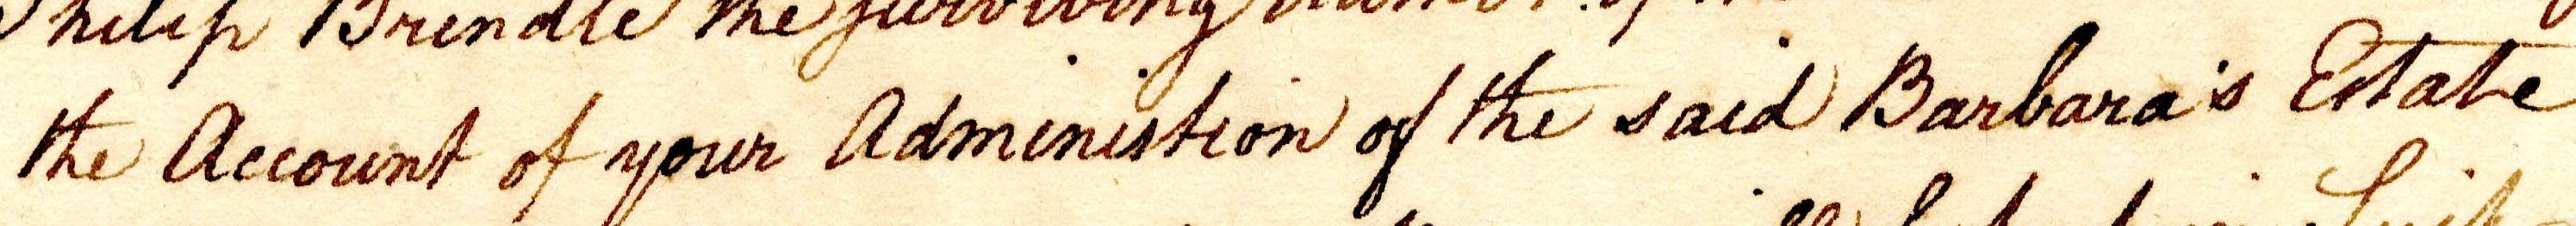the Account of your Administion of the said Barbara's Estate
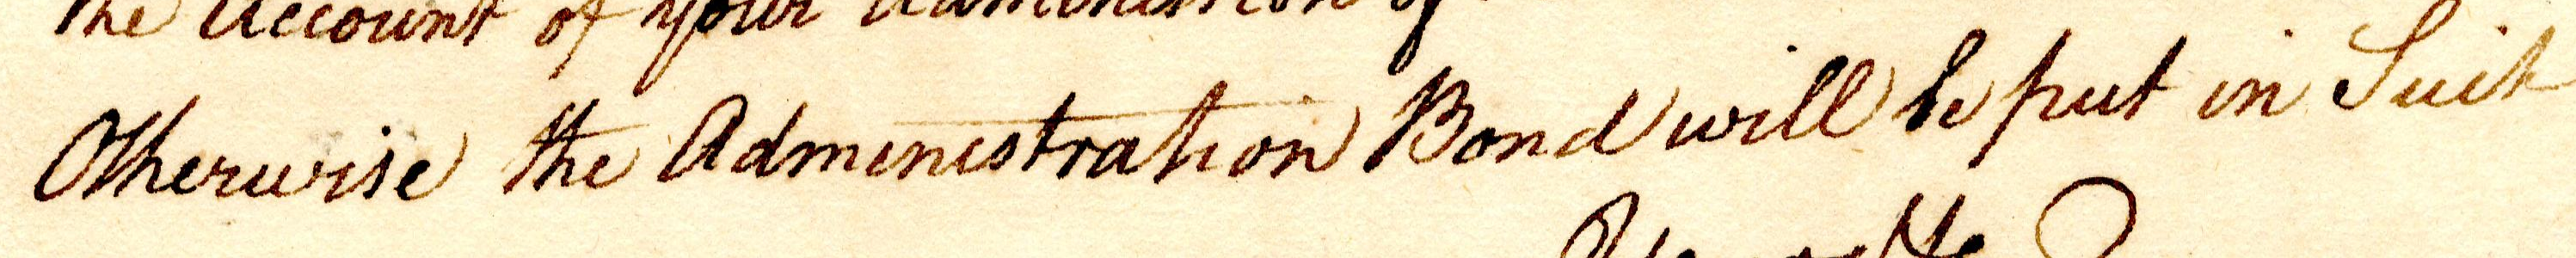Otherwise the Administration Bond will be put in Suit
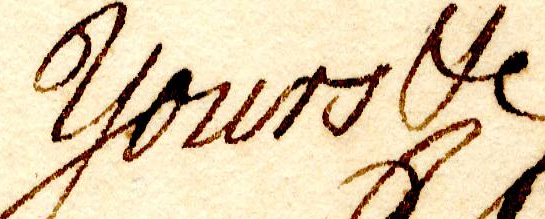Yours &c
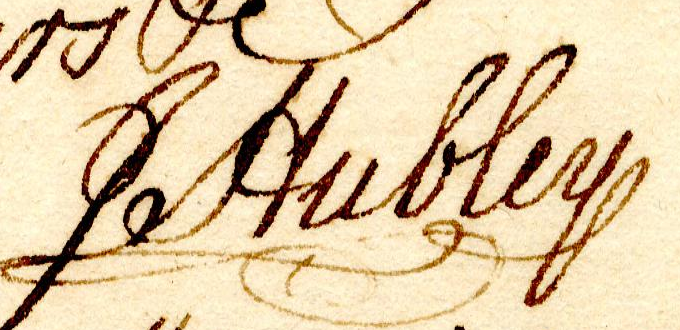J. Hubley
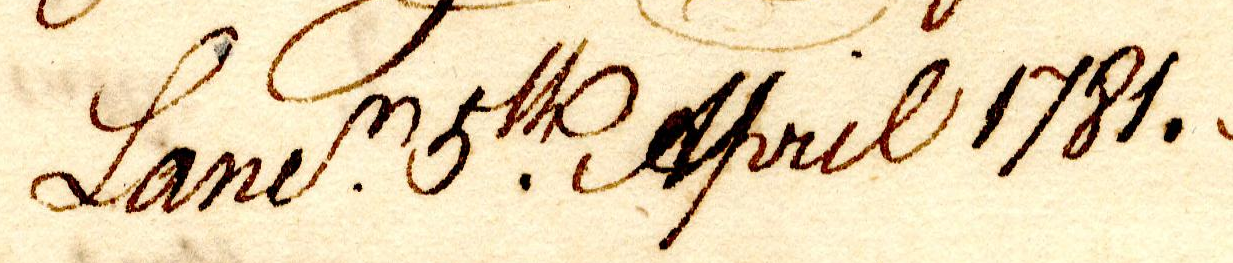Lanc^r. 5^th. April 1781.
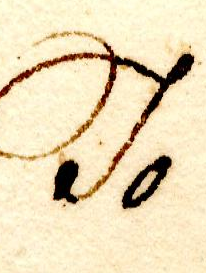To
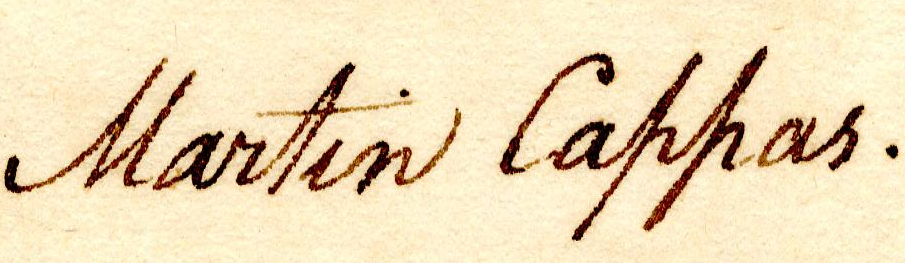Martin Cappas
